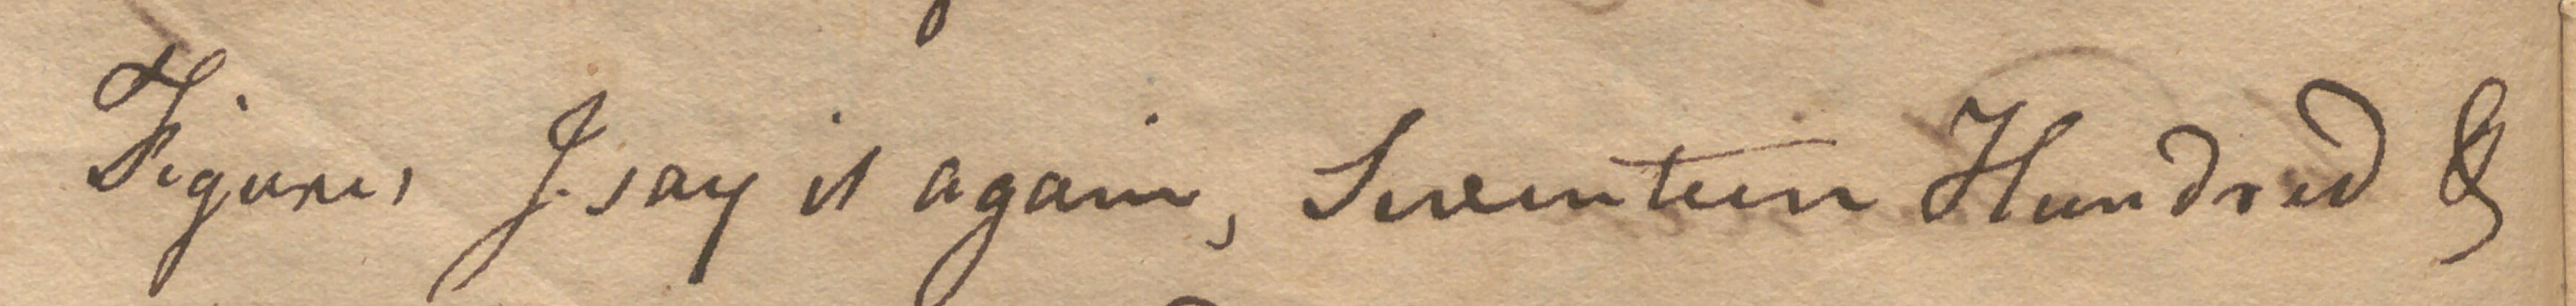Figures I say it again, seventeen Hundred &
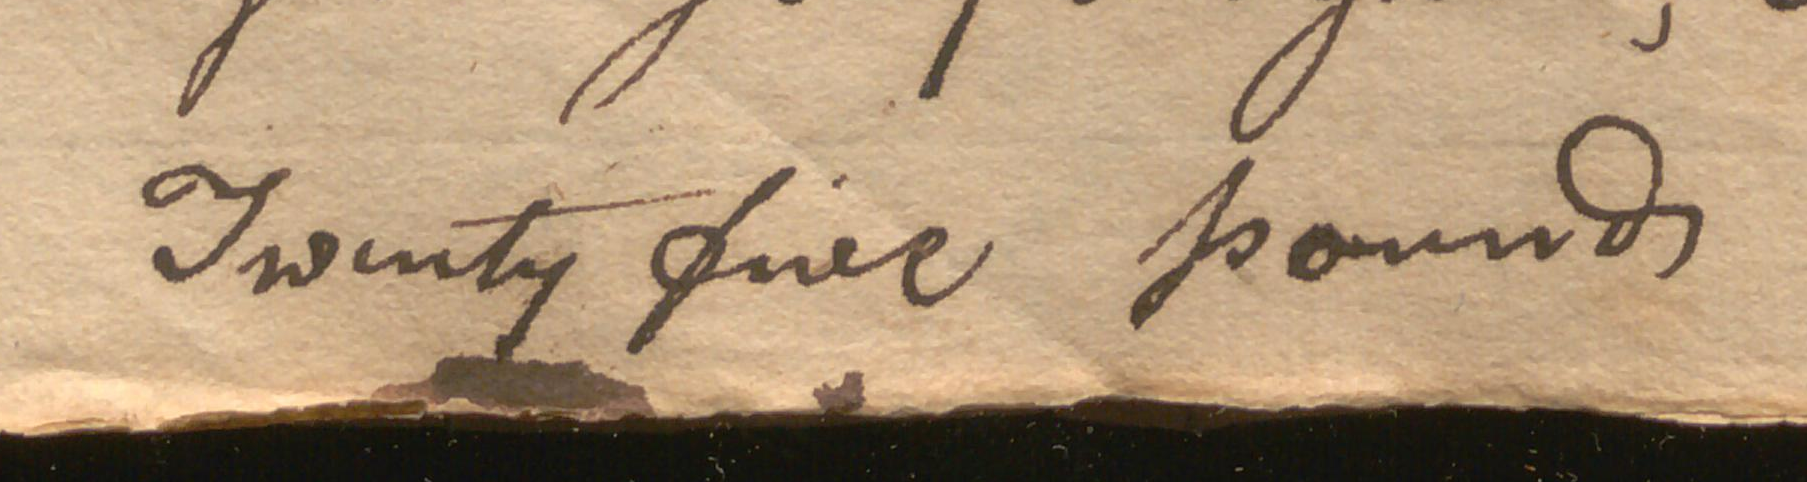Twenty five pounds
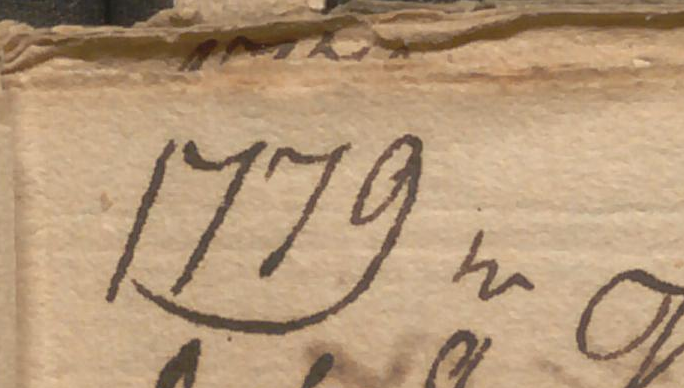1779
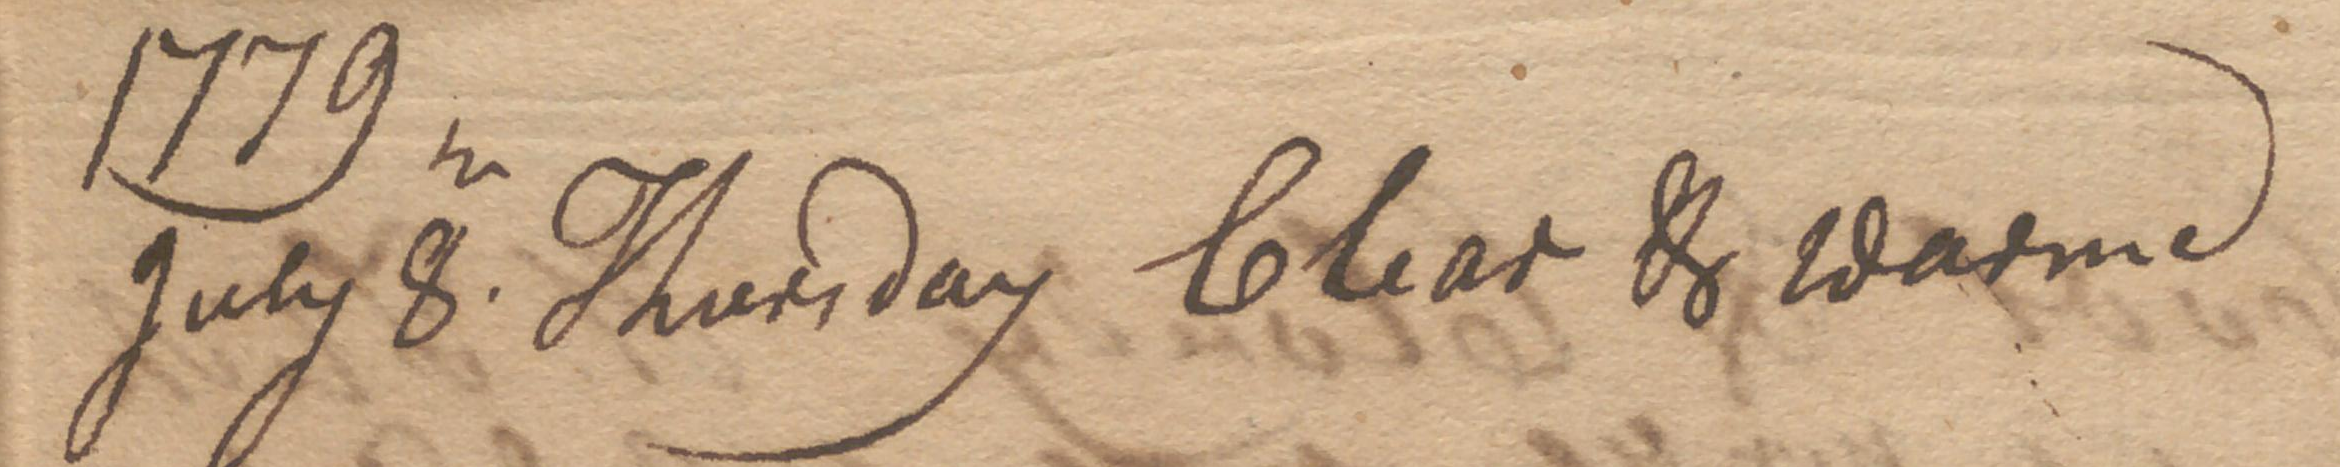July 8^th. Thursday Clear & Warme
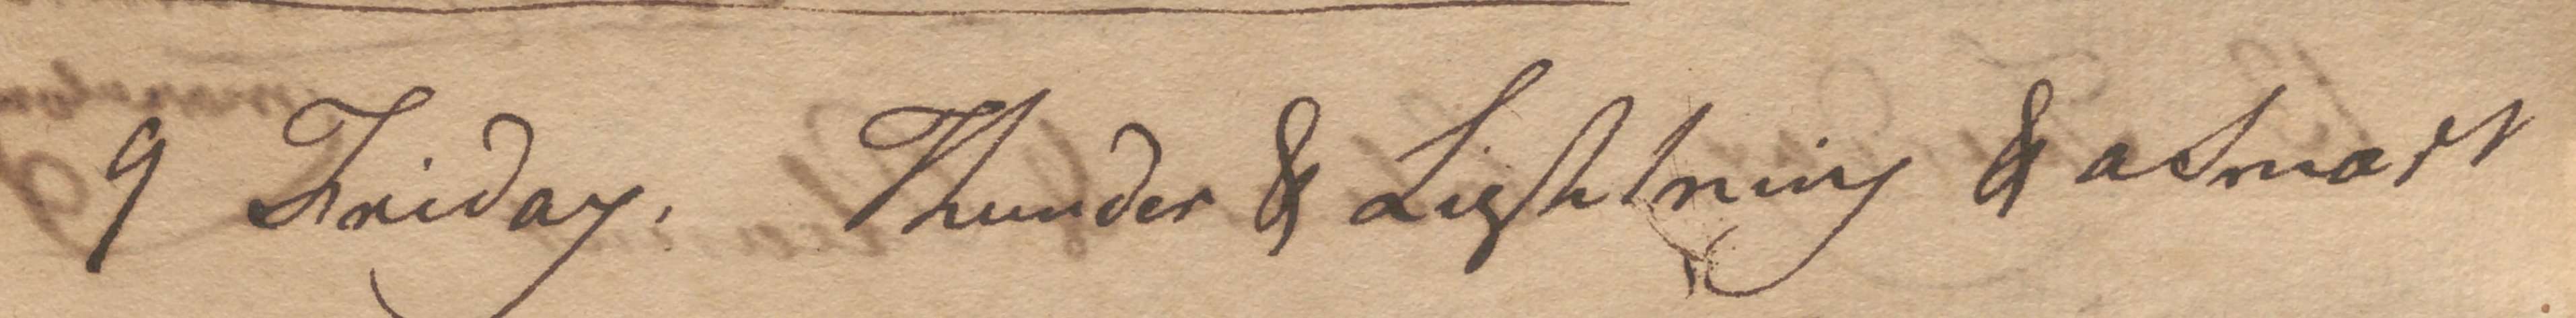9 Friday. Thunder & Lightnig & a smart
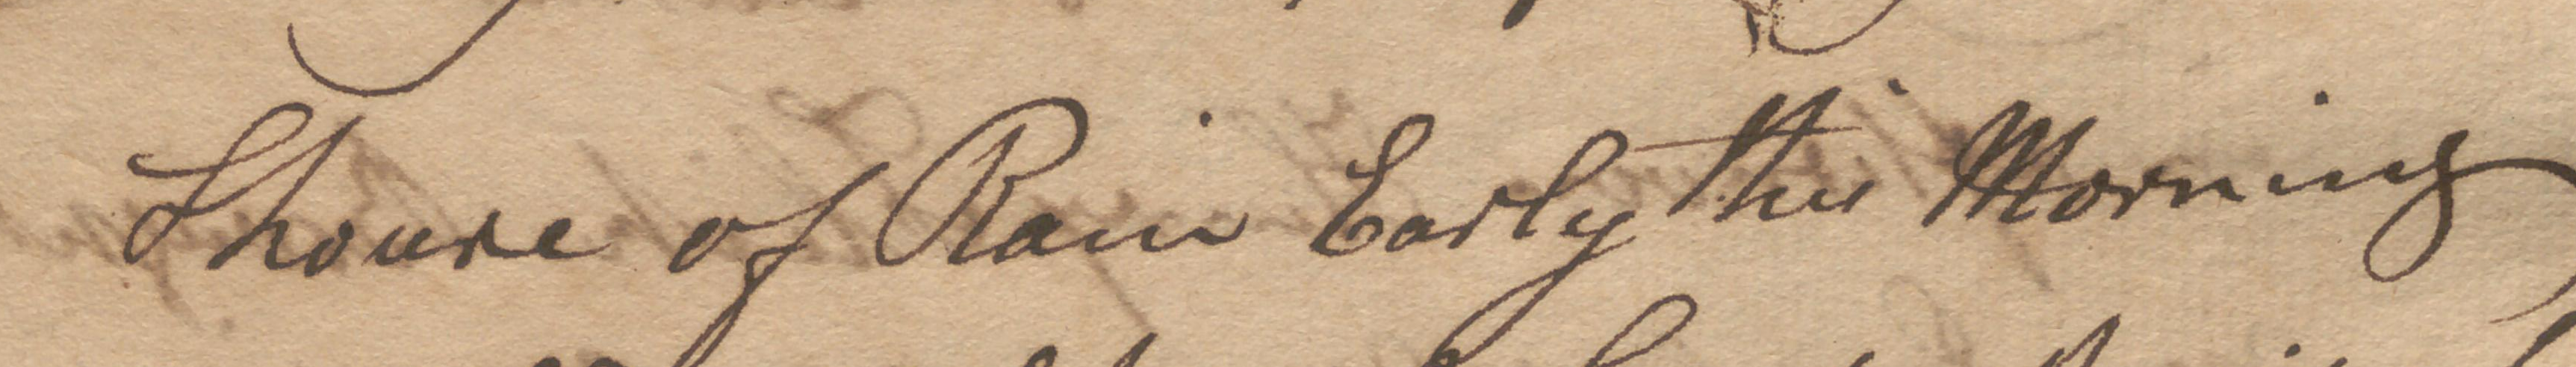shoure of Rain Early this Morning
